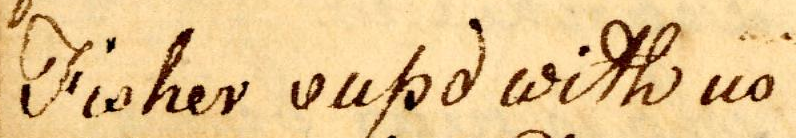Fisher supd with us
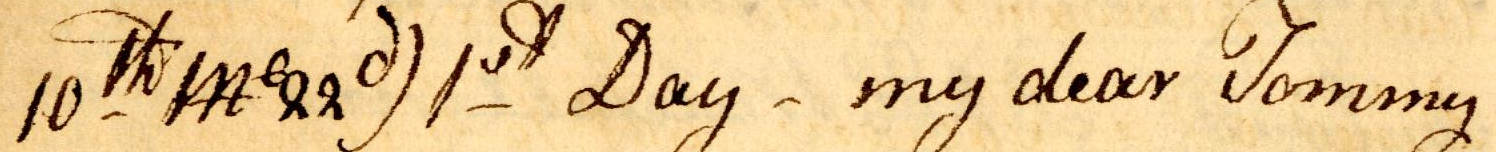10^th M^o 22^d) 1^st Day- my dear Tommy
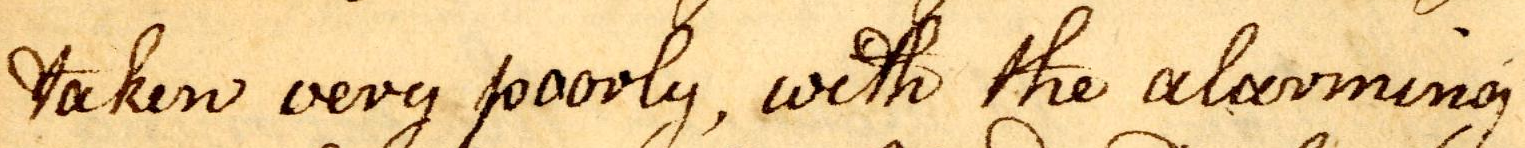taken very poorly, with the alarming
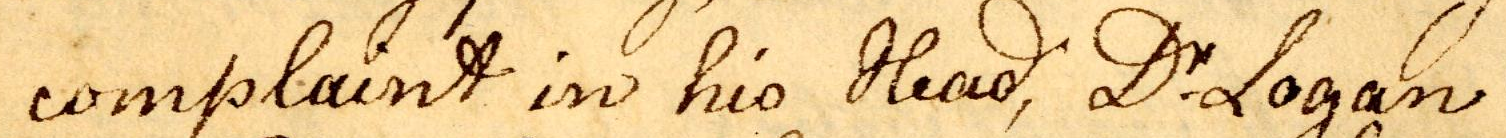complaint in his Head, D^r Logan
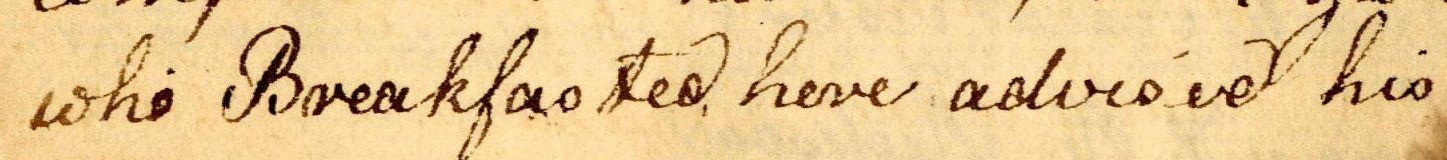who Breakfasted here advised his
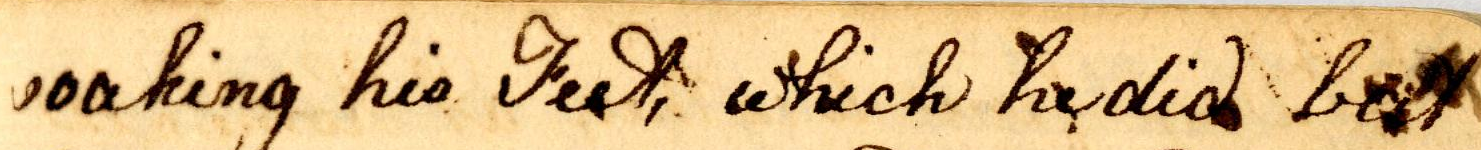soaking his Feet, which he did but
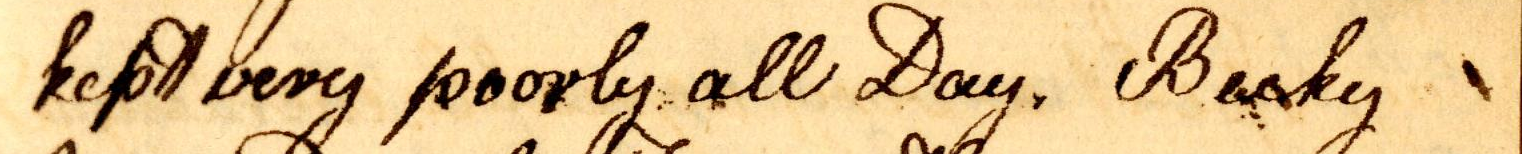kept very poorly all Day, Becky
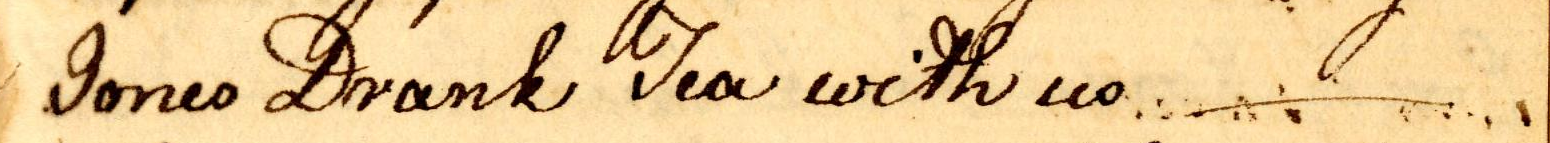Jones Drank Tea with us-
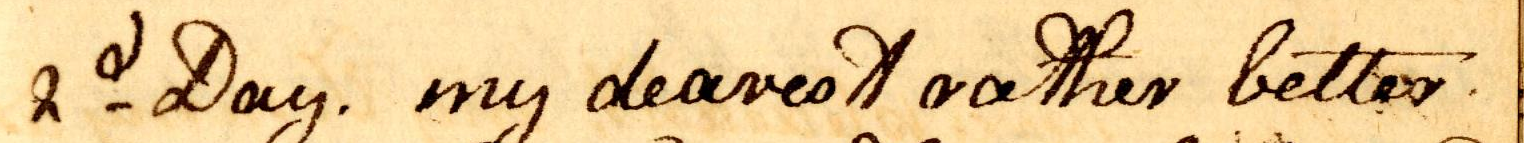2^d Day. my dearest rather better
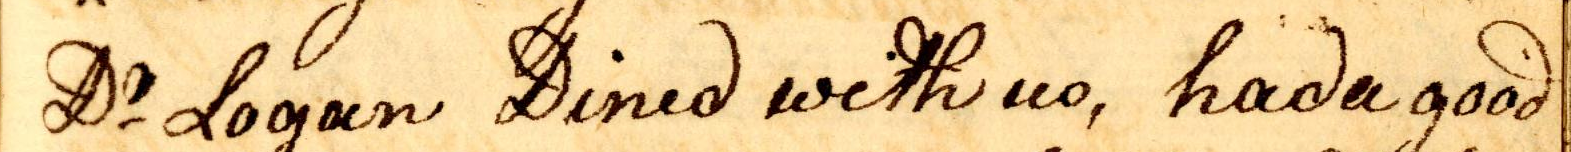D^r Logan Dined with us, had a good
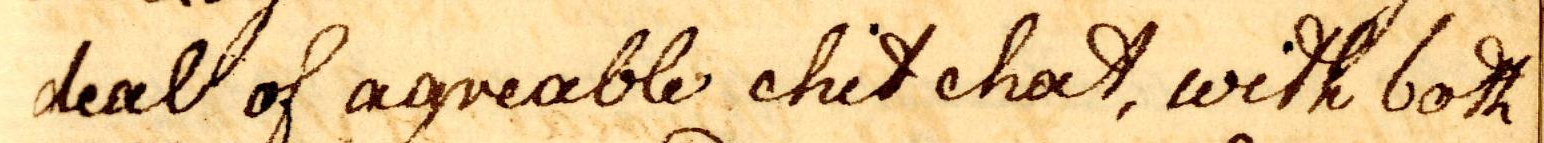deal of agreable chit chat, with both
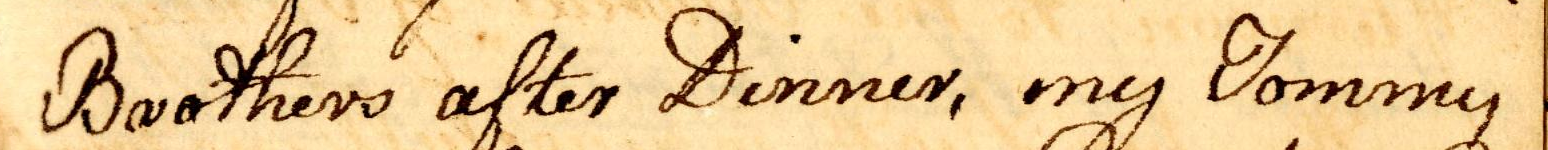Brothers after Dinner, my Tommy
